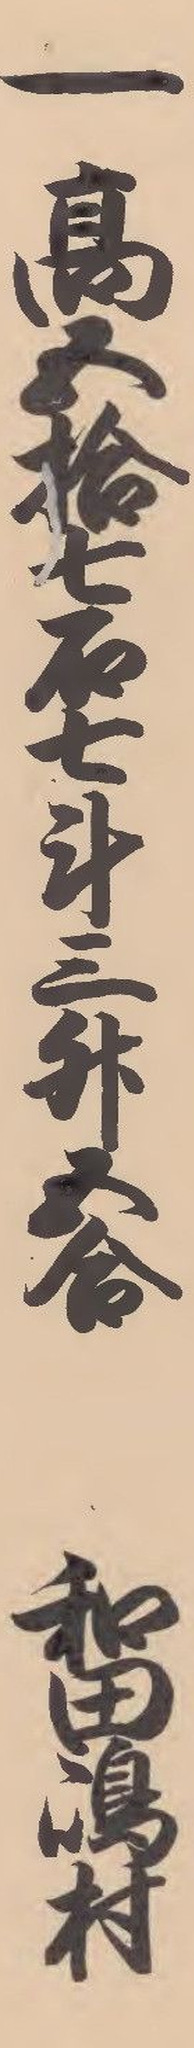一高五拾七石七斗三升五合和田島村
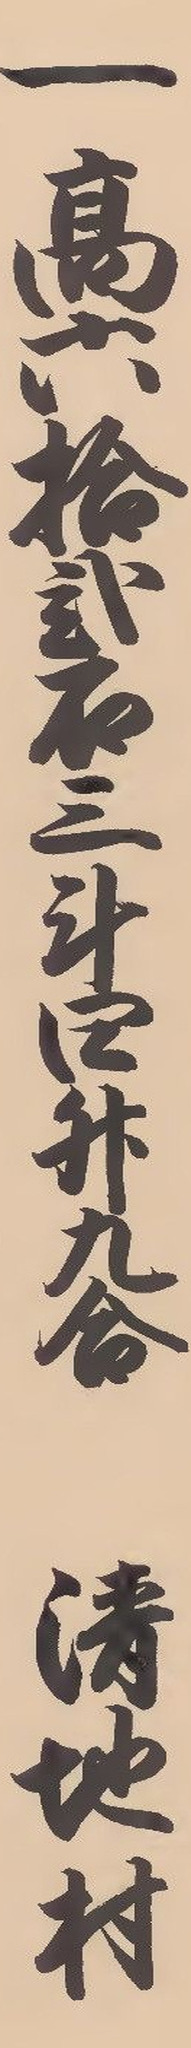一高六拾弐石三斗四升九合清地村
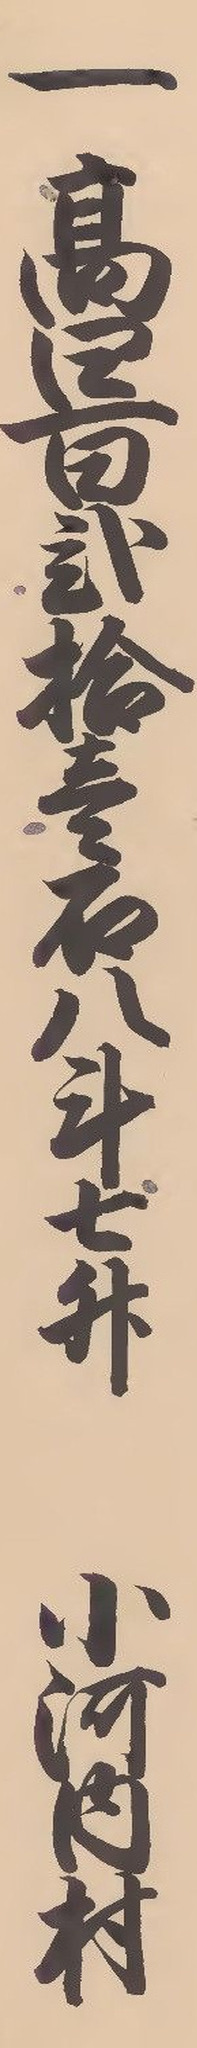一高四百弐拾壱石八斗七升小河内村

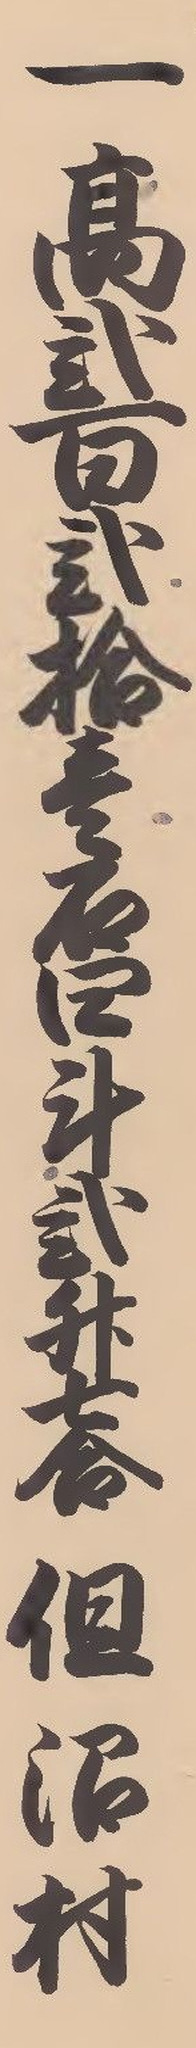一高弐百弐拾壱石四斗弐升七合但沼村
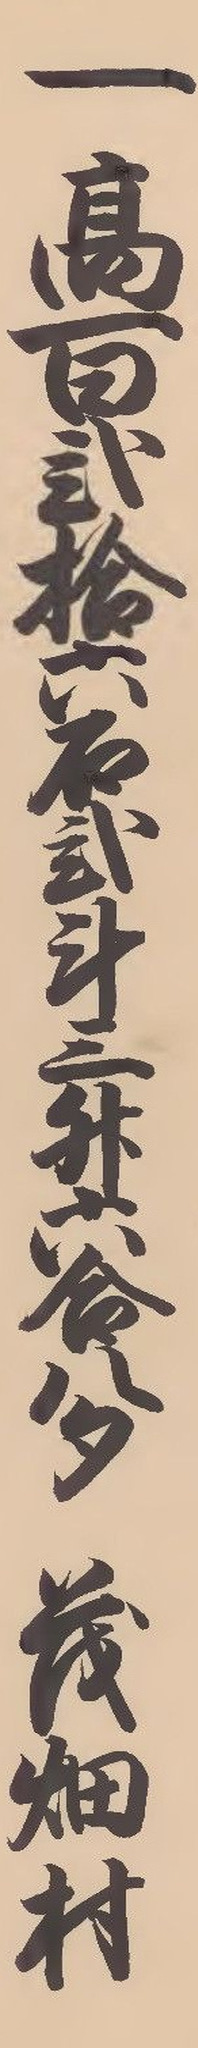一高百弐拾六石弐斗三升六合八勺茂畑村
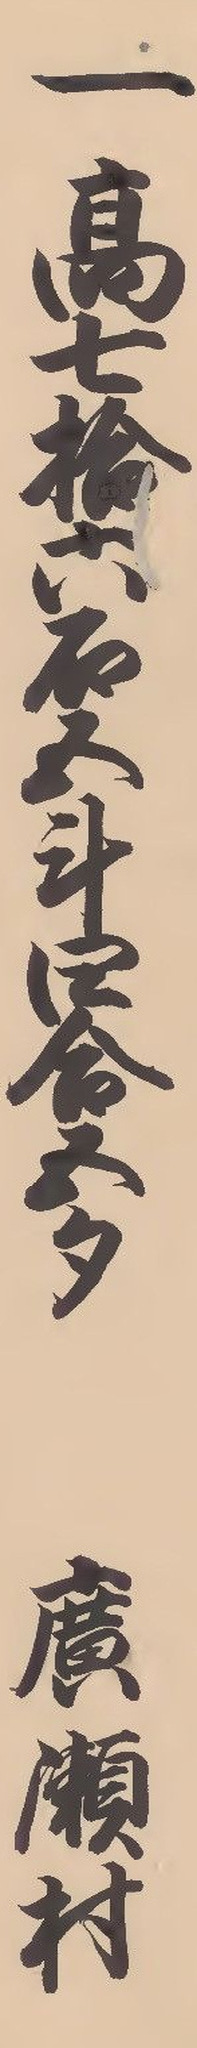一高七拾六石五斗四合五勺広瀬村
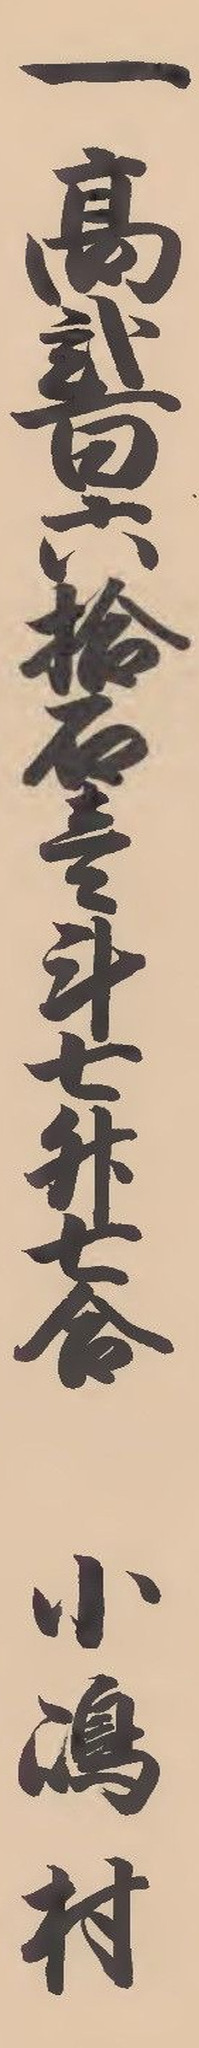一高弐百六拾石壱斗七升七合小島村
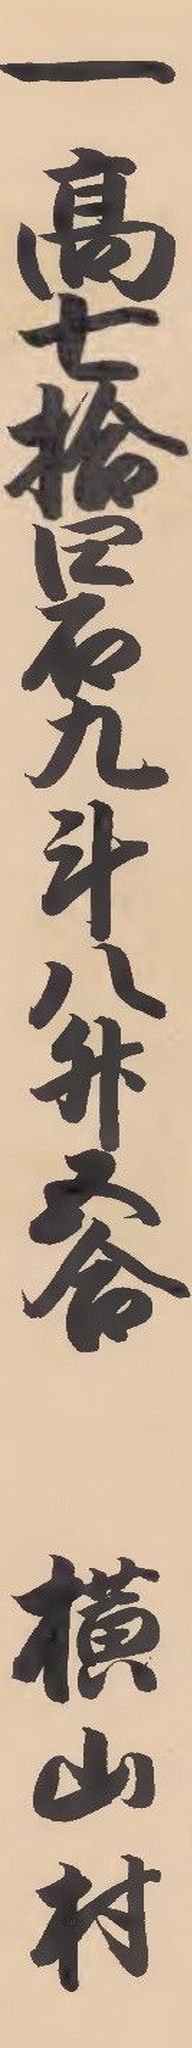一高七拾四石九斗八升五合横山村
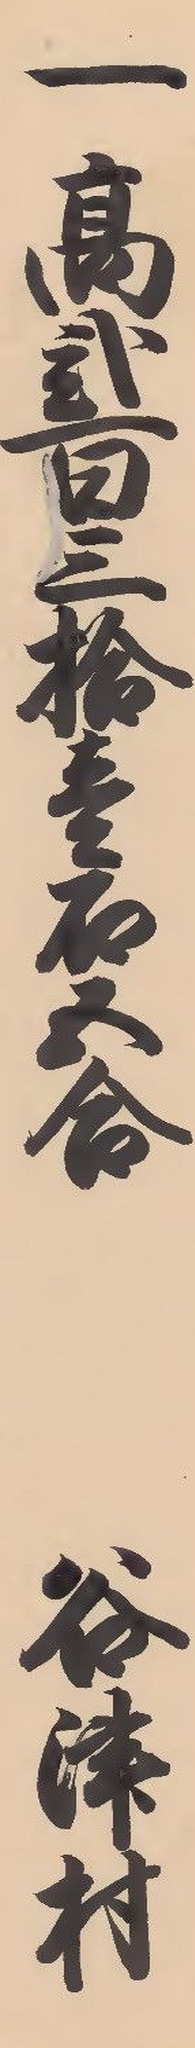一高弐百三拾壱石五合谷津村
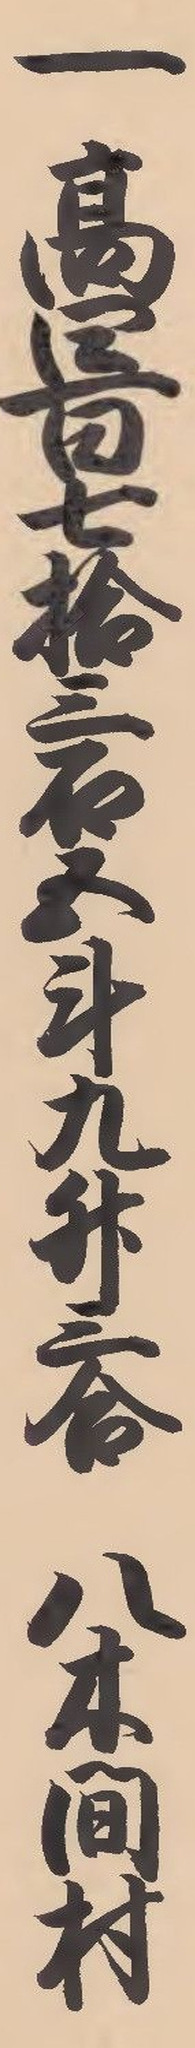一高四百七拾三石五斗九升三合八木間村
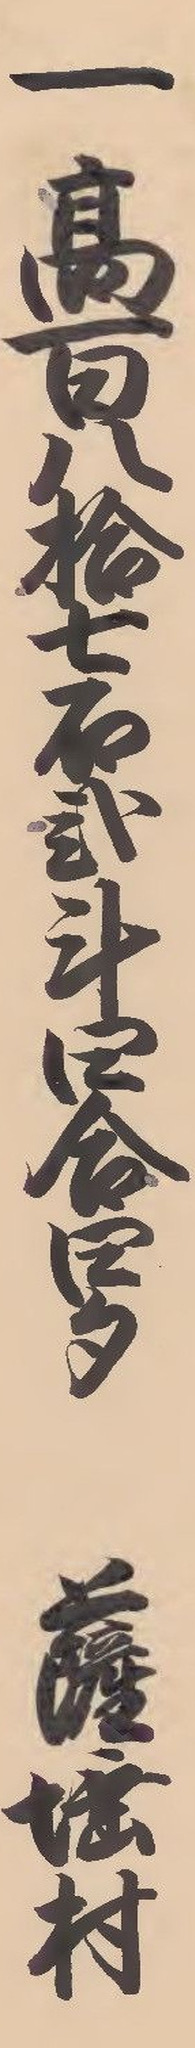一高百八拾七石弐斗四合四勺薩埵村

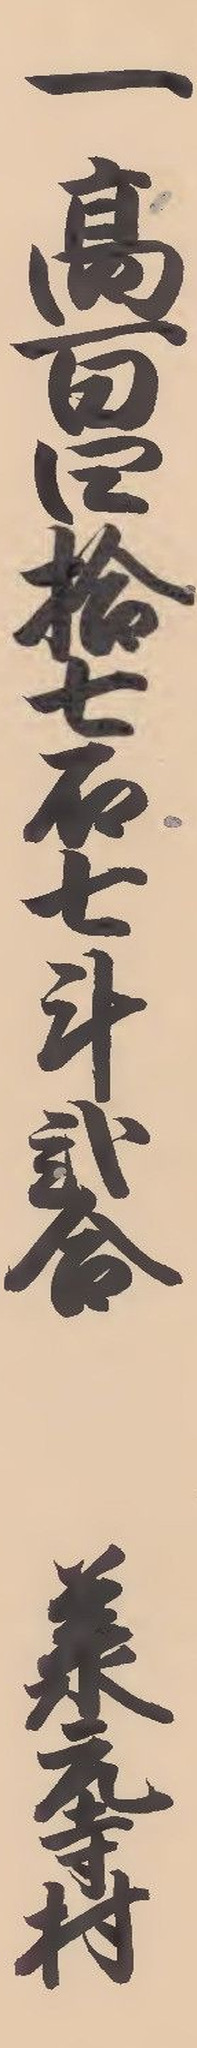一高百四拾七石七斗弐合承元寺村
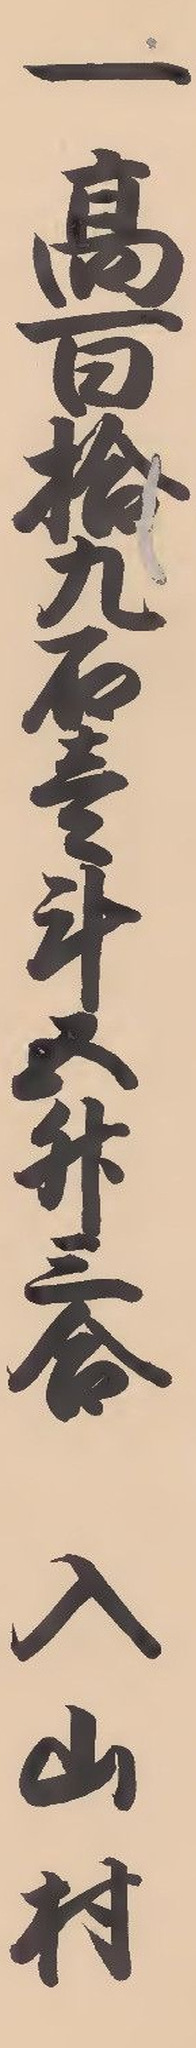一高百拾九石壱斗五升三合入山村
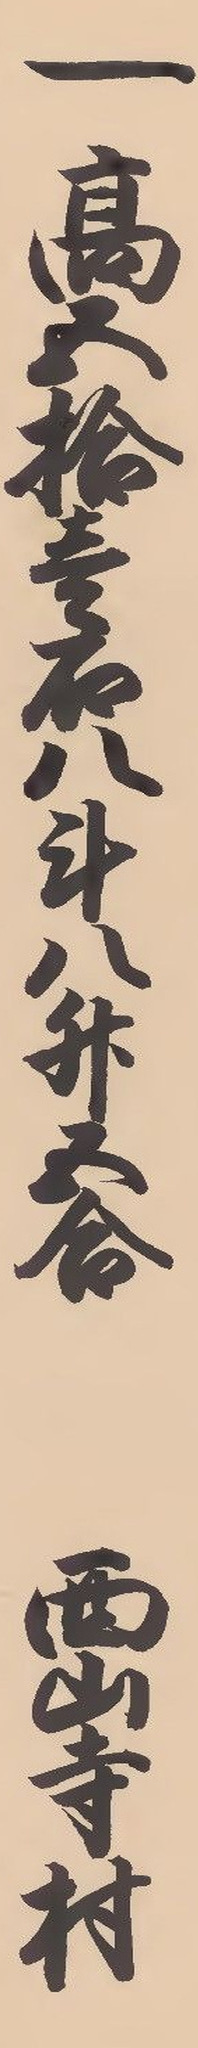一高五拾壱石八斗八升五合西山寺村
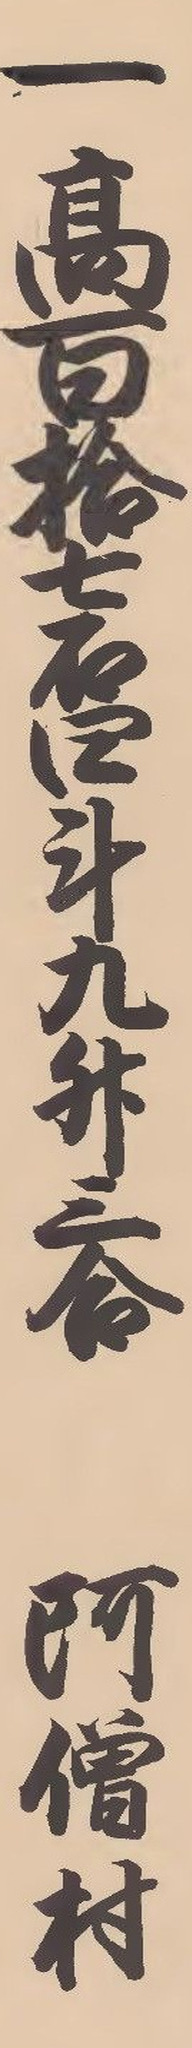一高百拾七石四斗九升三合阿僧村
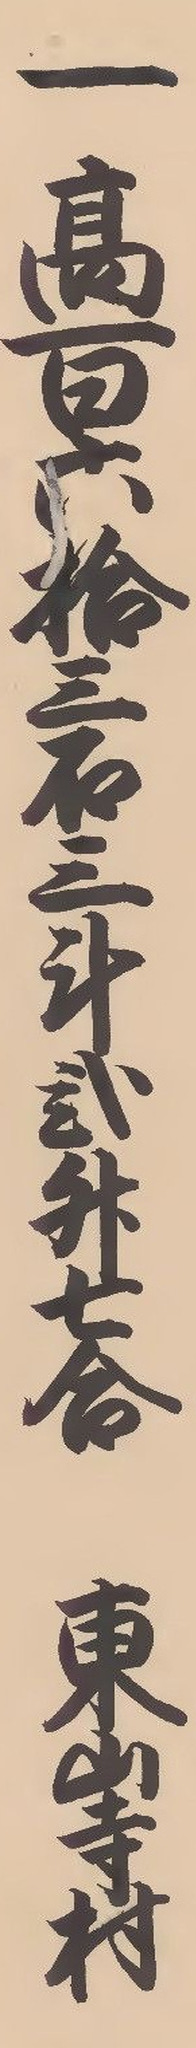一高百六拾三石三斗弐升七合東山寺村
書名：駿河国郷帳
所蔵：国立公文書館 National Archives of Japan
